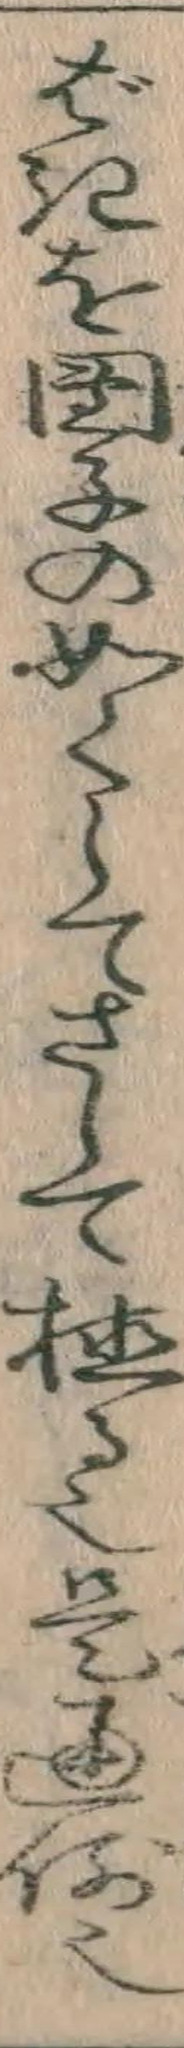ばきを団子の如くしてさして植る也是通例也
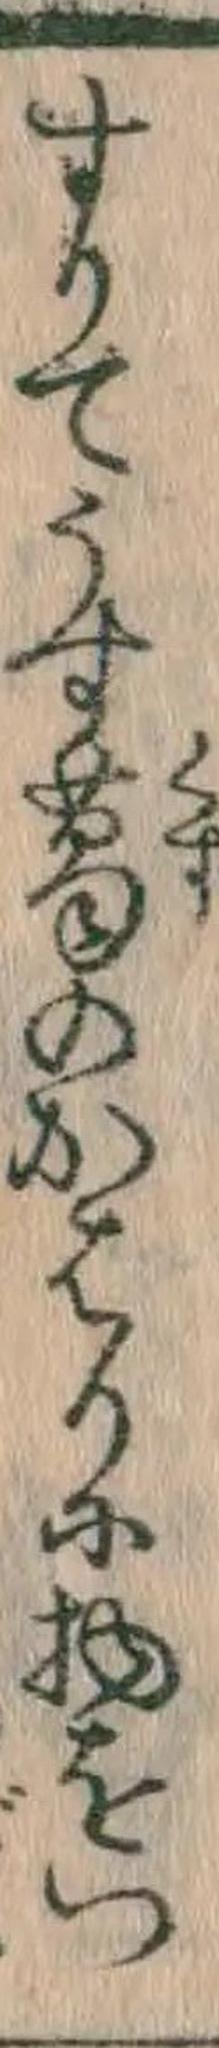すりてうす葛のかはりに物をい
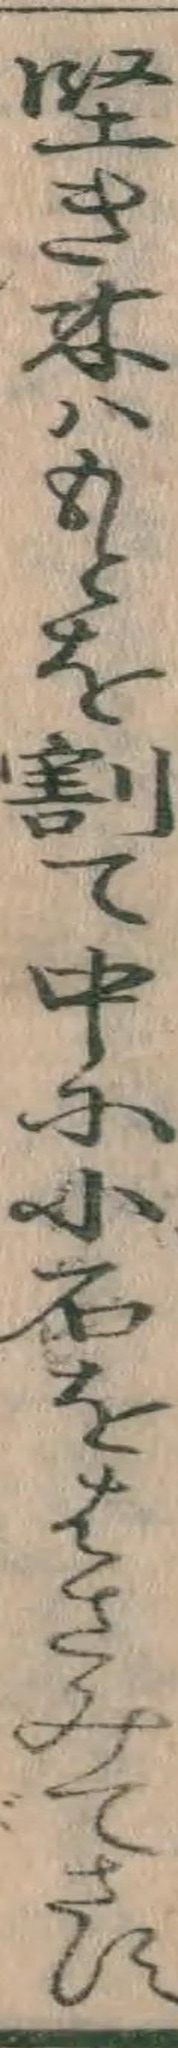堅き木はもとを割て中に小石をはさみてさす
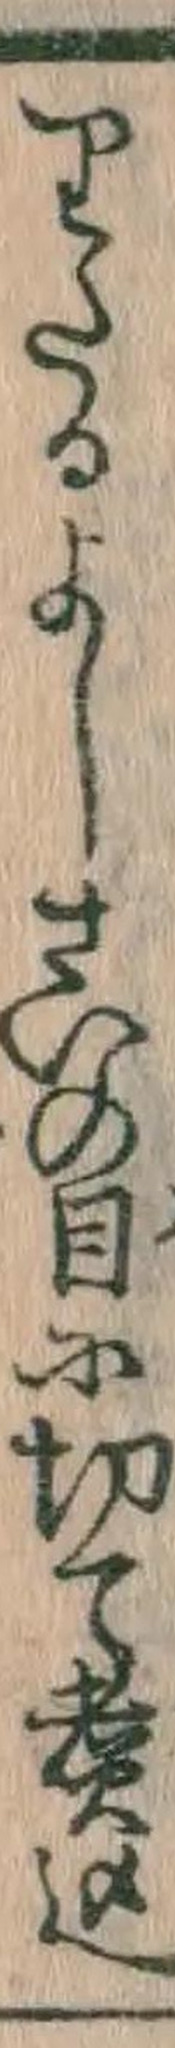りたるよしさいの目に切て煮込
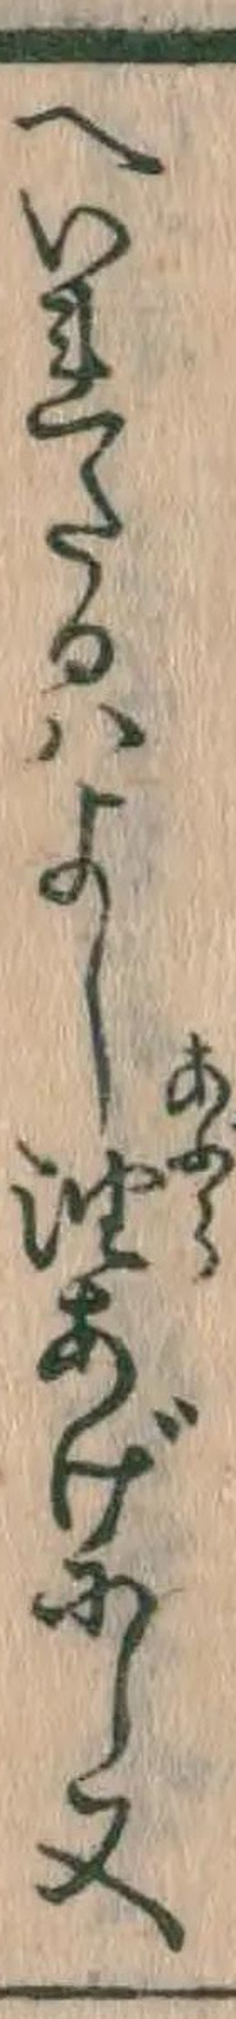へいれたるはよし油あげにし又
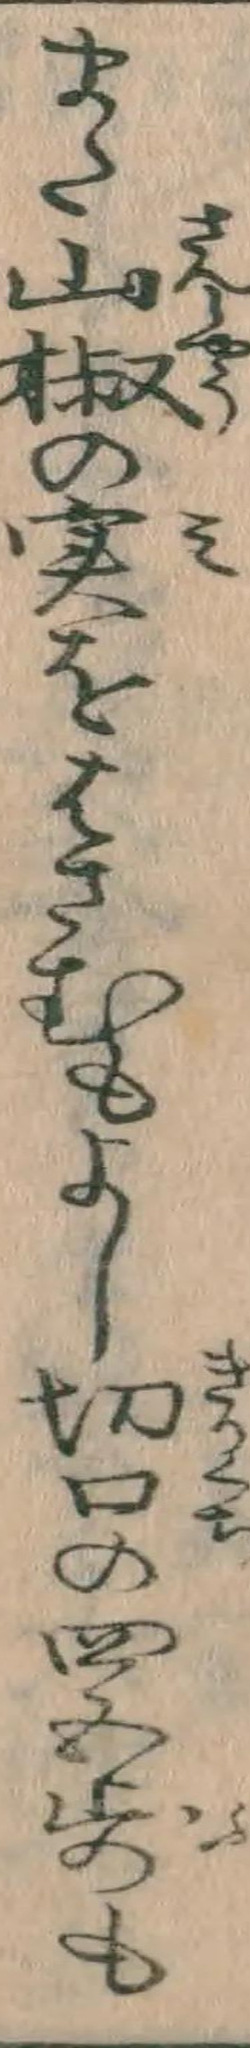また山椒の実をはさむもよし切口の四五歩も
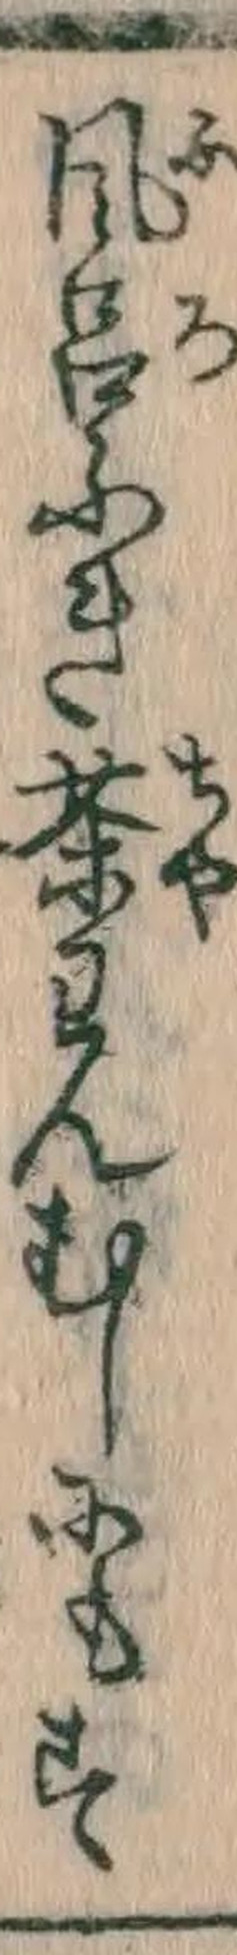風呂ふき茶わんむしにもす
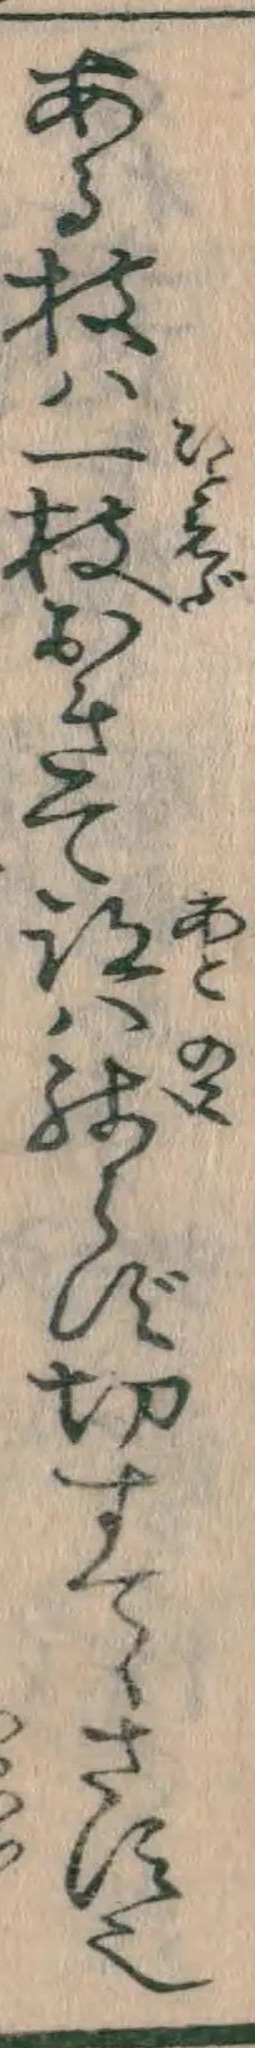ある枝は一枝おきて跡は残らず切すてゝさす也
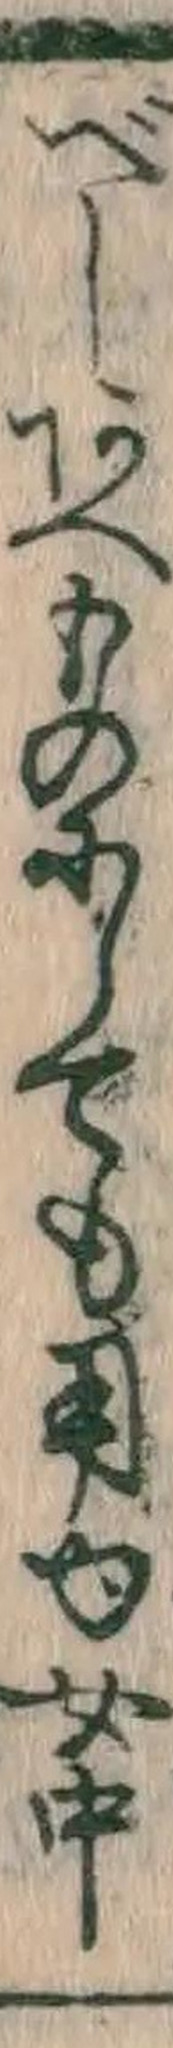べしあへものにしても用ゆ女中
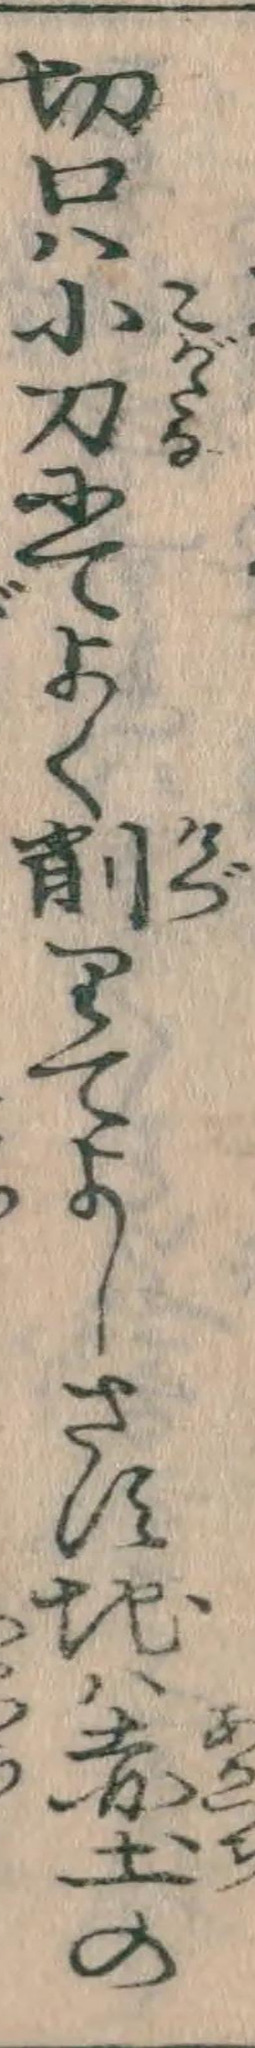切口は小刀にてよく削りてよしさす地は赤土の
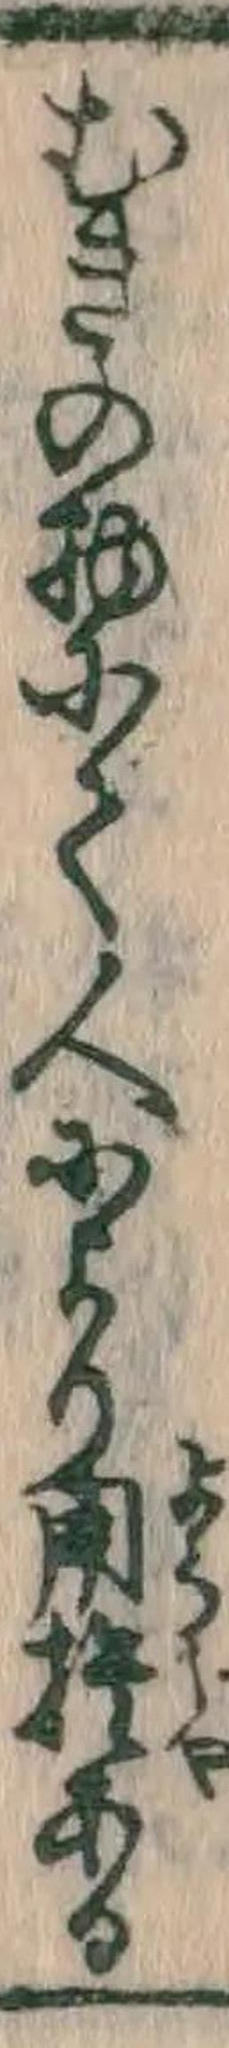むきの物にて人により用捨ある
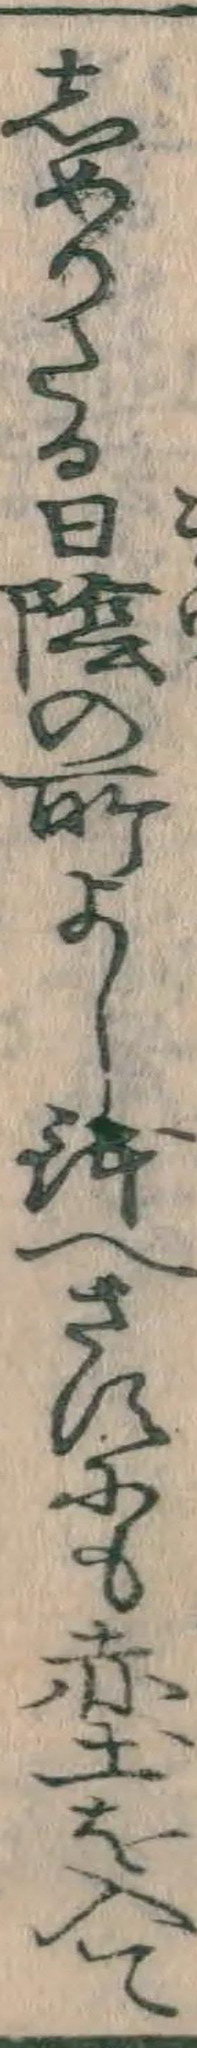しめりたる日陰の所よし鉢へさすにも赤土を入て
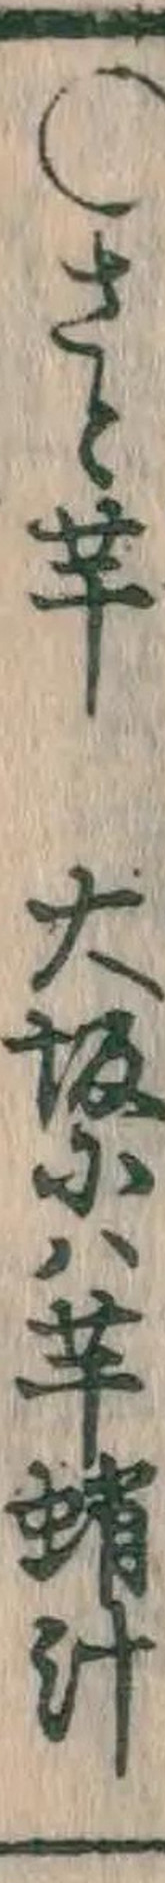○さと芋大坂には芋蛸汁
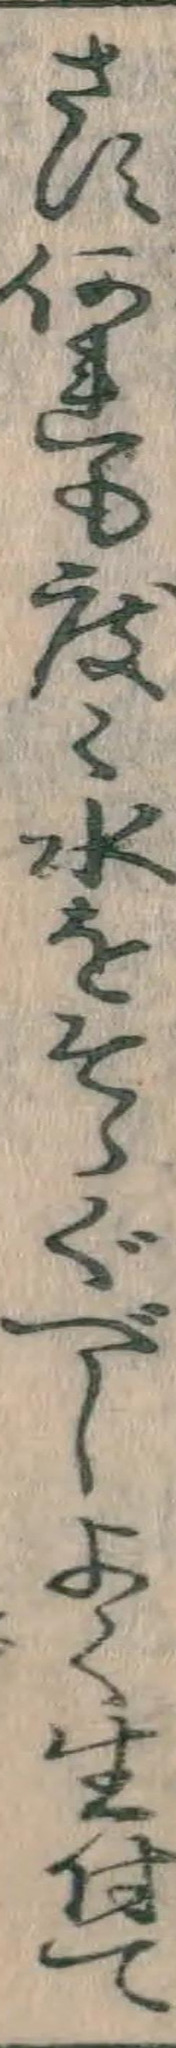さす何れも度々水をそゝぐべしよく生付て
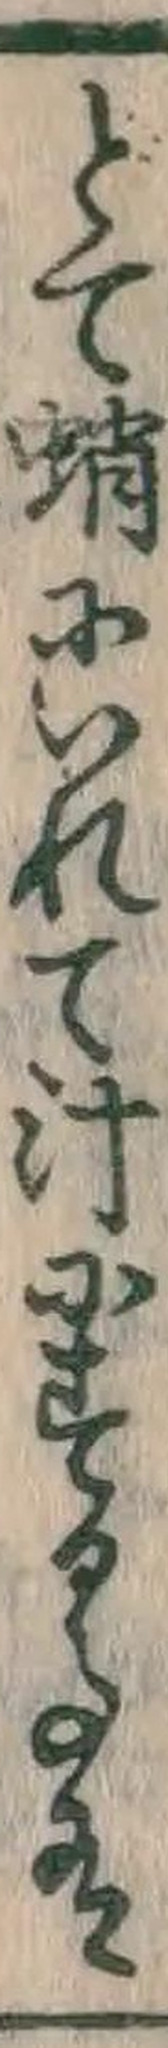とて蛸にいれて汁にする事有
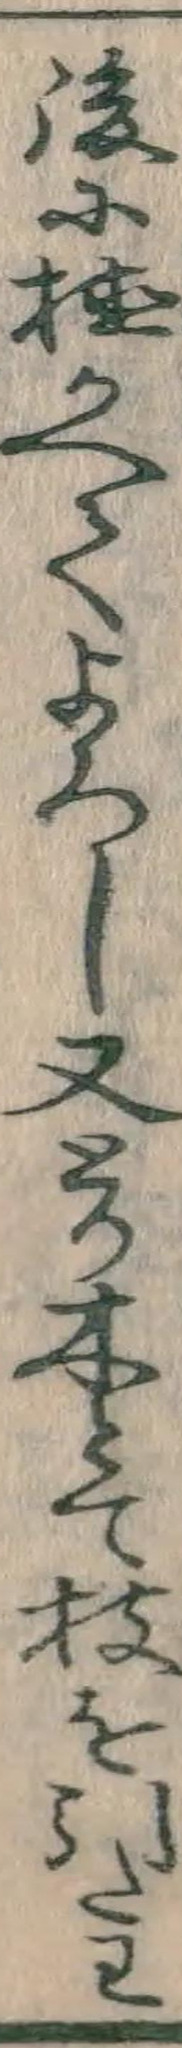後に植かへてよろし又とり木とて枝を引たわ
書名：広益秘事大全 3巻. [5]
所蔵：国立国会図書館 National Diet Library, JAPAN
